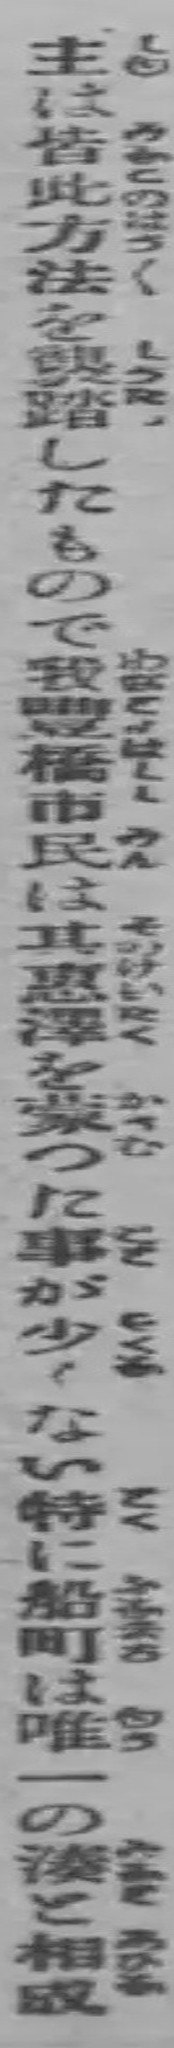主は皆此方法を襲踏したもので我豊橋市民は其恵沢を蒙つた事が少くない特に船町は唯一の湊と相成
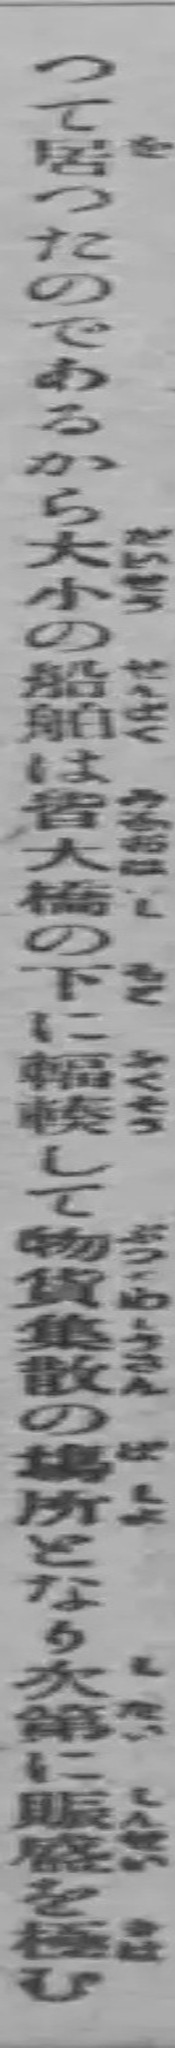つて居つたのであるから大小の船舶は皆大橋の下に輻輳して物貨集散の場所となり次第に賑盛を極む
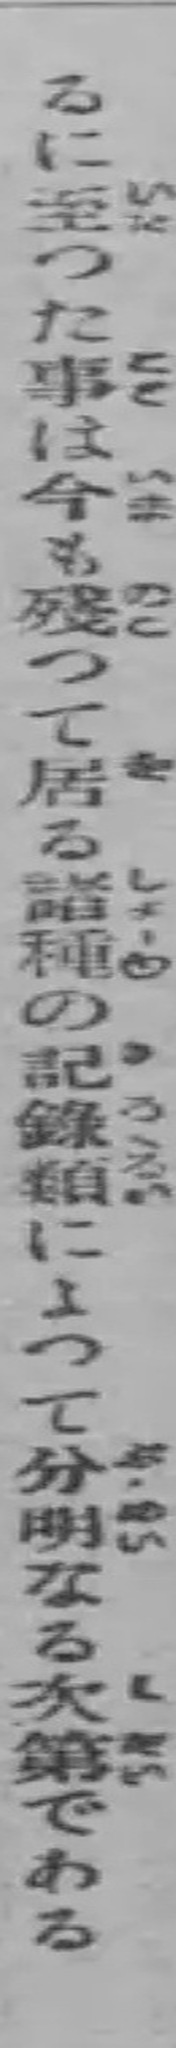るに至つた事は今も残つて居る諸種の記録類によつて分明なる次第である
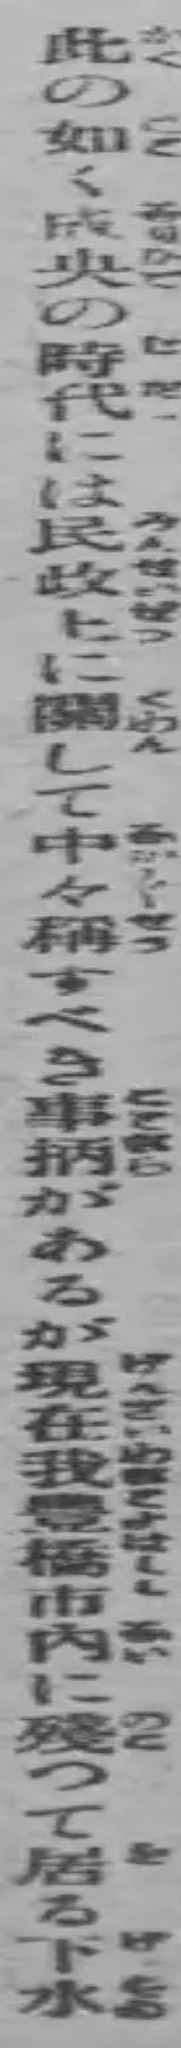此の如く成央の時代には民政上に関して中々称すべき事柄があるが現在我豊橋市内に残つて居る下水
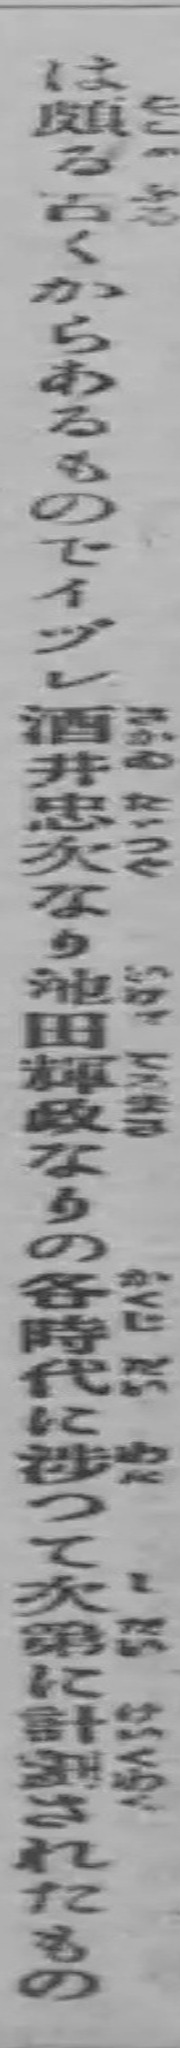は頗る古くからあるものでイヅレ酒井忠次なり池田輝政なりの各時代に渉つて次第に計劃されたもの
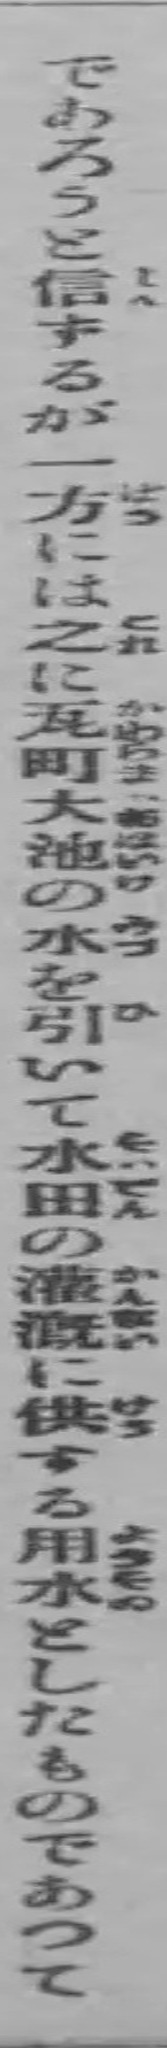であろうと信ずるが一方には之に瓦町大池の水を引いて水田の灌漑に供する用水としたものであつて
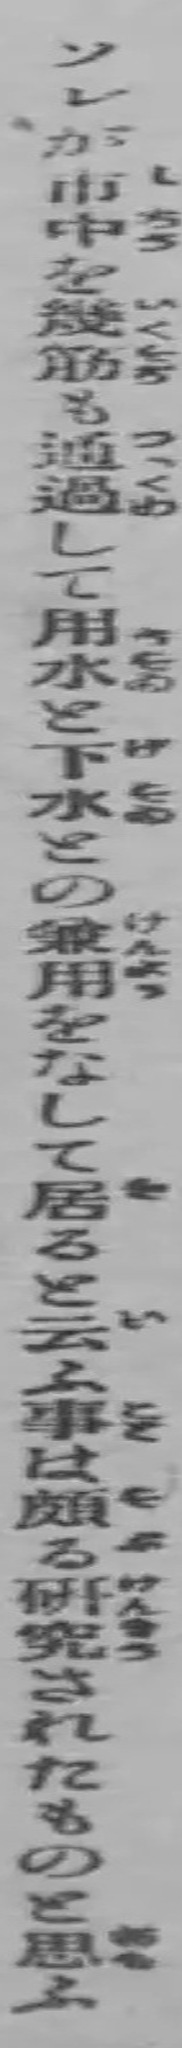ソレが市中を幾筋も通過して用水と下水との兼用をなして居ると云ふ事は頗る研究されたものと思ふ
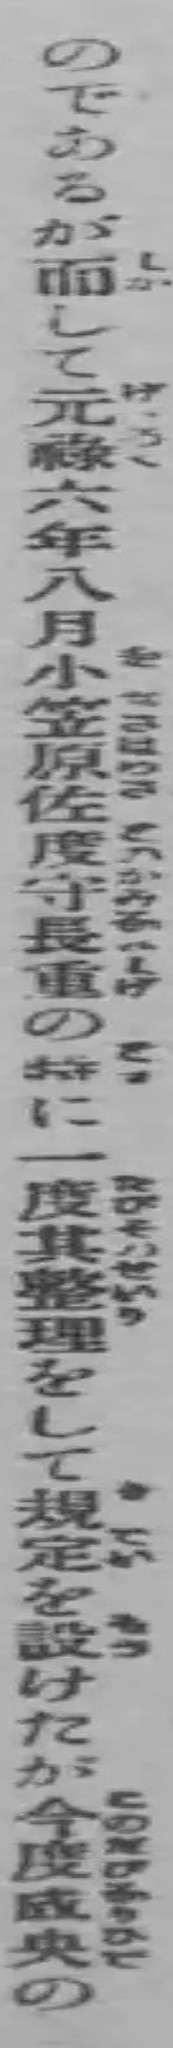のであるが而して元禄六年八月小笠原佐渡守長重の時に一度其整理をして規定を設けたが今度成央の
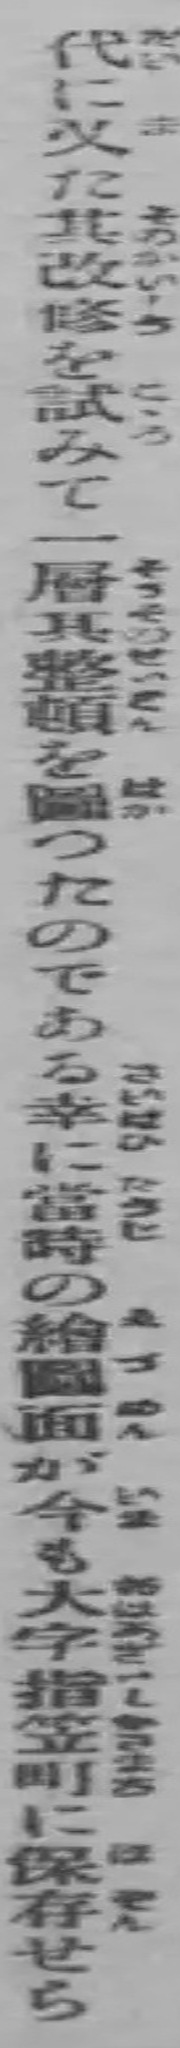代に又た其改修を試みて一層其整頓を図つたのである幸に当時の絵図面が今も大字指笠町に保存せら
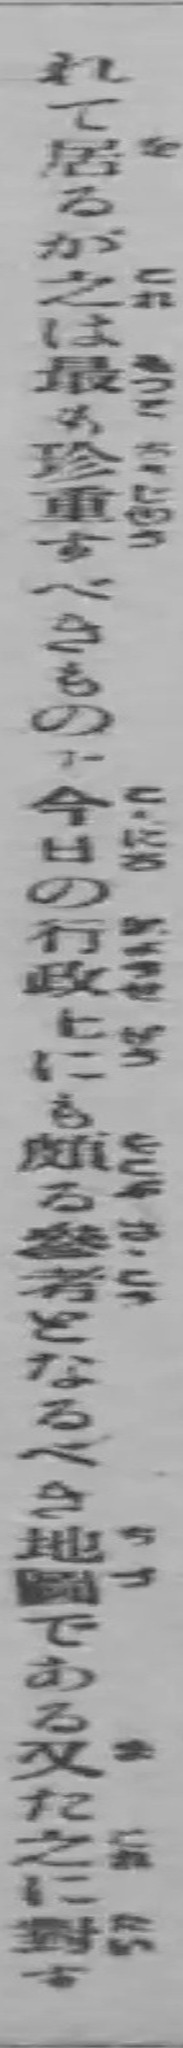れて居るが之は最も珍重すべきもので今日の行政上にも頗る参考となるべき地図である又た之に対す
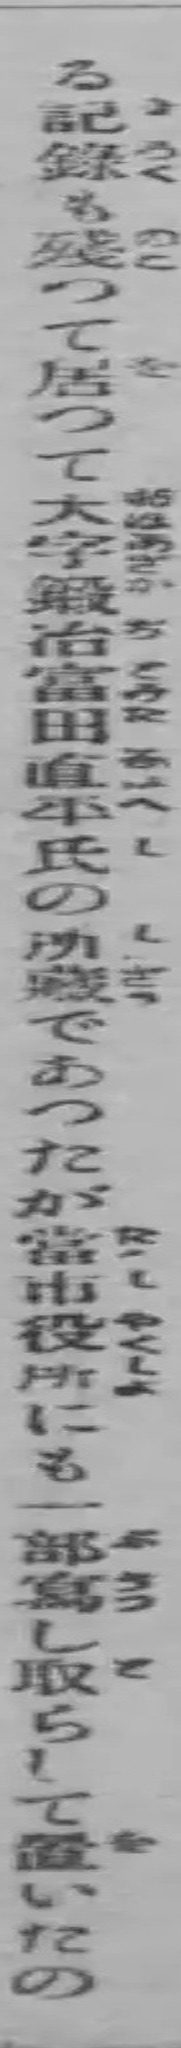る記録も残つて居つて大字鍛冶富田直平氏の所蔵であつたが当市役所にも一部写し取らして置いたの
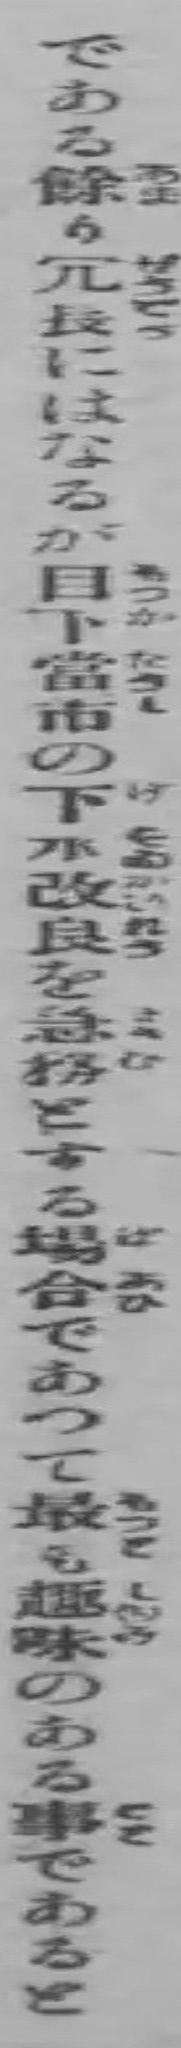である余り冗長にはなるが目下当市の下水改良を急務とする場合であつて最も趣味のある事であると
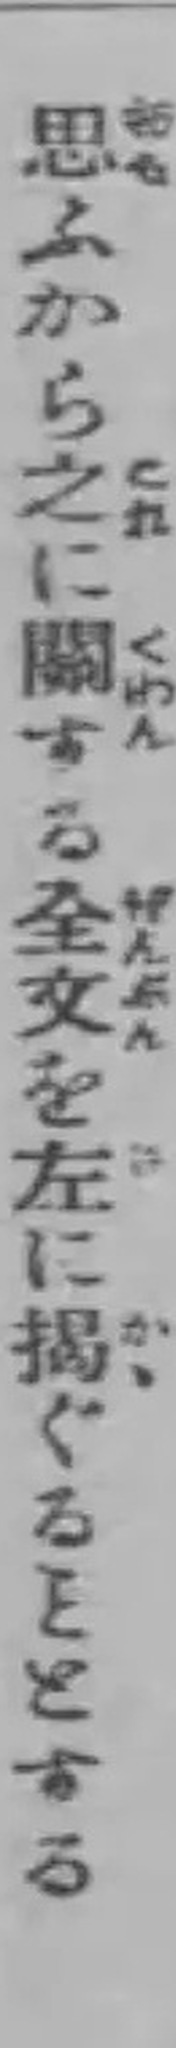思ふから之に関する全文を左に掲ぐることとする
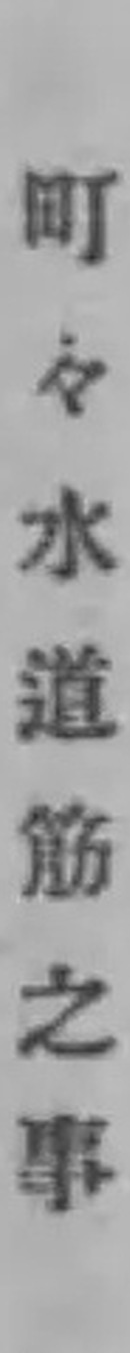町々水道筋之事
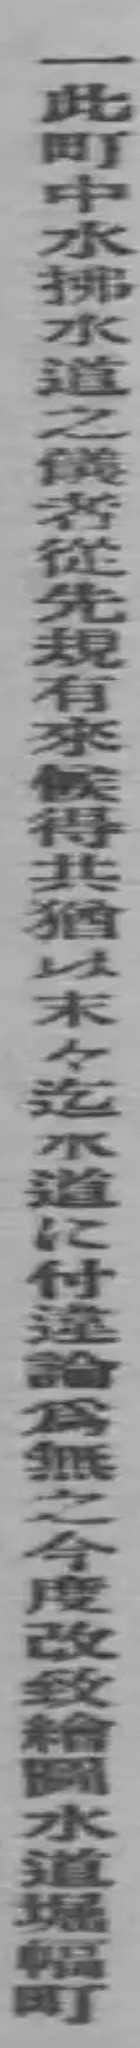一此町中水払水道之儀者従先規有来候得共猶以末々迄水道に付違論為無之今度改致絵図水道堀幅町

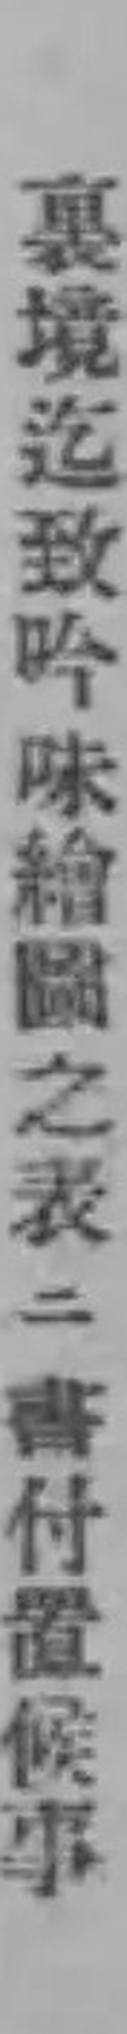裏境迄致吟味絵図之表ニ書付置候事
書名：豊橋市史談
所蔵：国立国会図書館 National Diet Library, JAPAN
